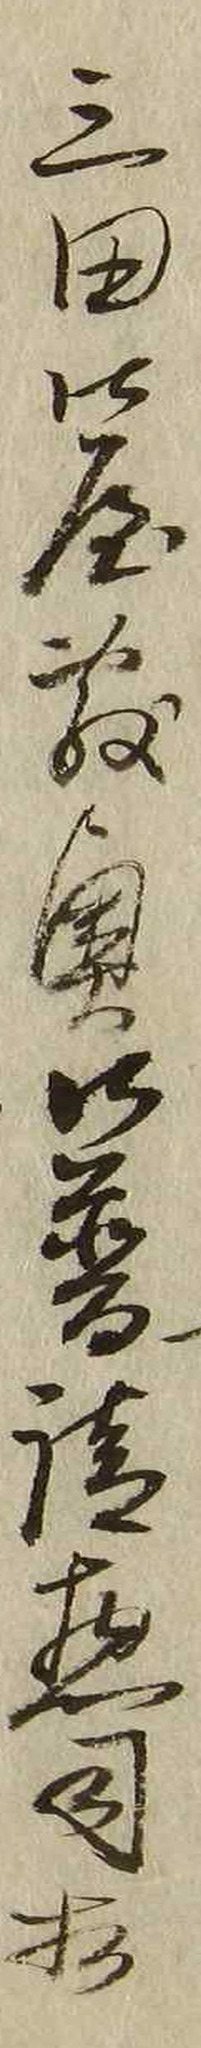三田御屋敷奥御普請惣司相
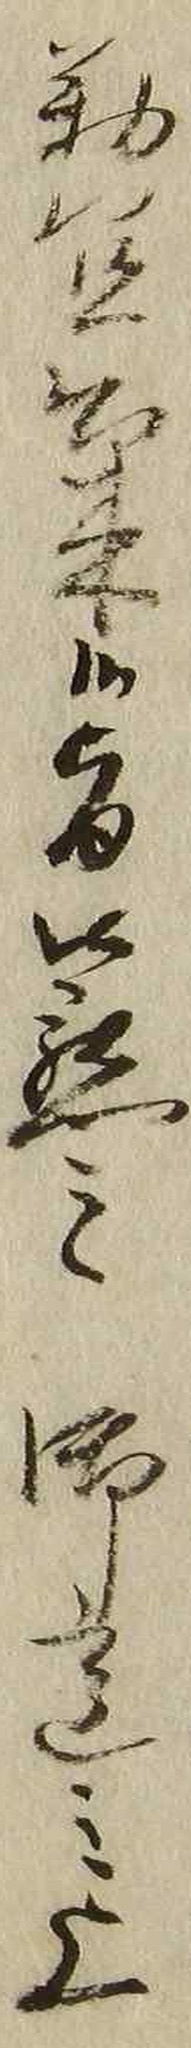勤出来候旨御懇之御意之上
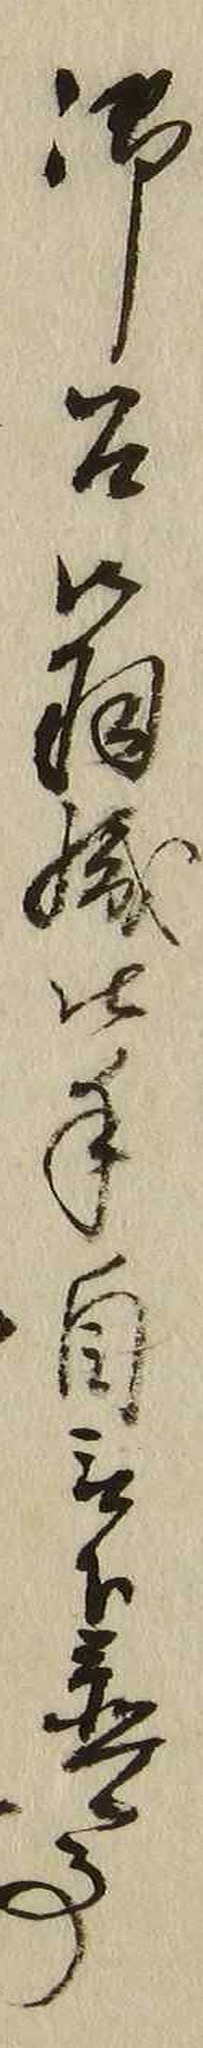御召御羽織御手自被下置候事
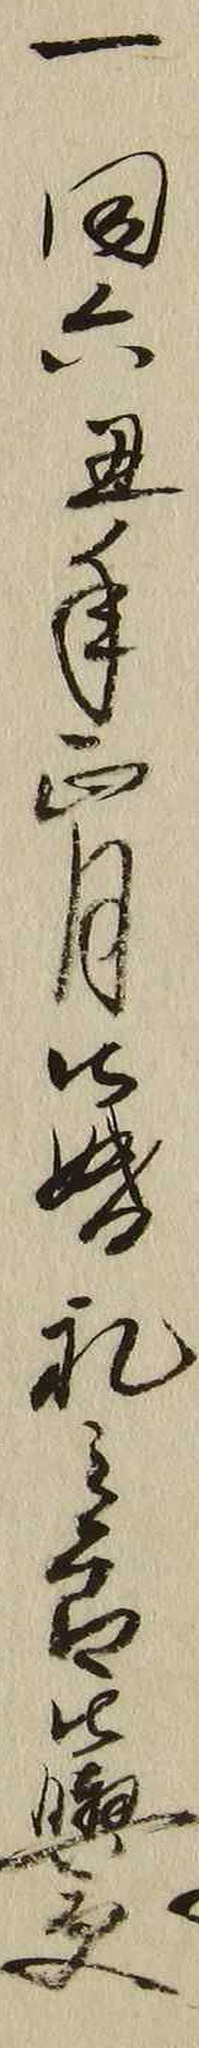一同六丑年正月御婚礼之節御輿受
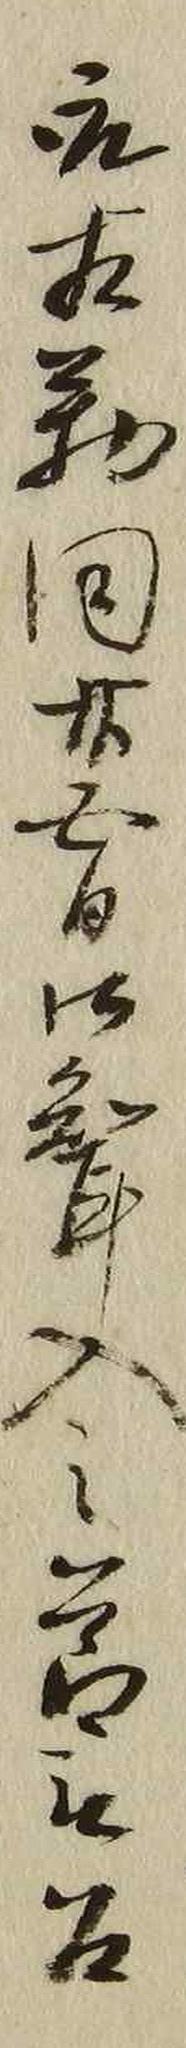取相勤同廿五日御婿入之節被召
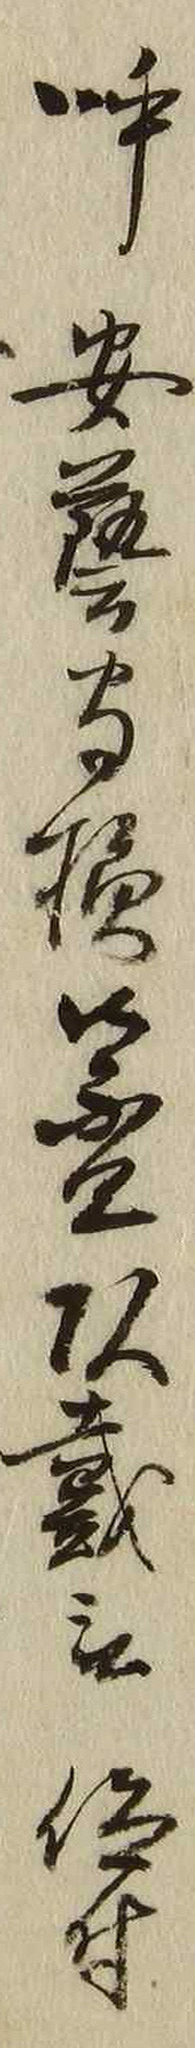呼安芸守様御盃頂戴被仰付
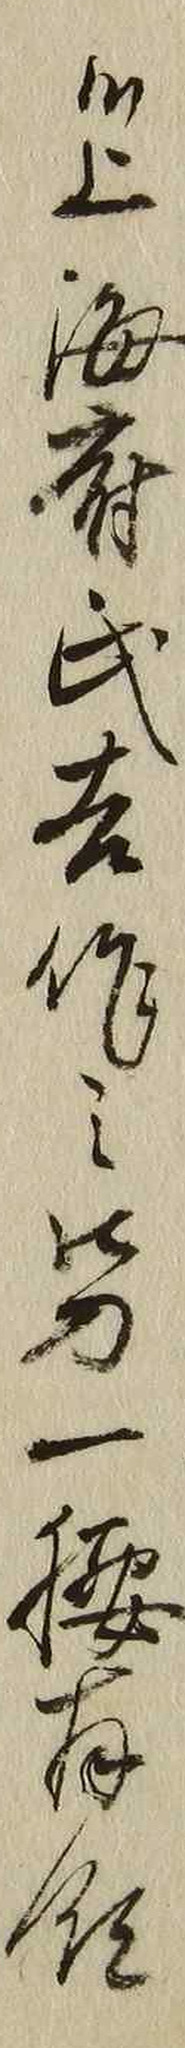候上海府氏吉作之御刀一腰拝領
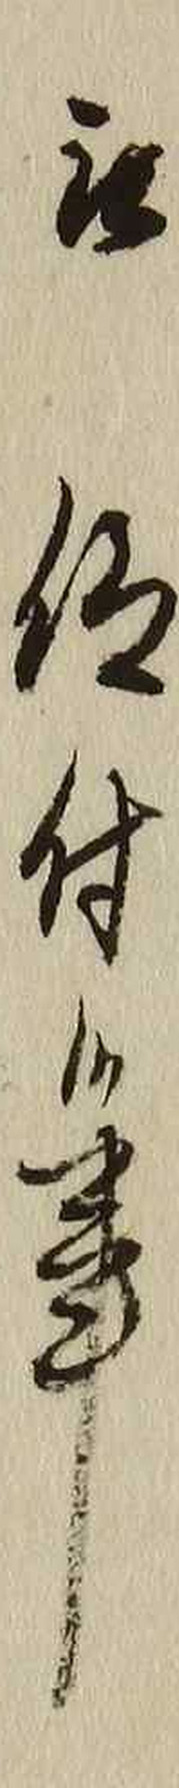被仰付候事
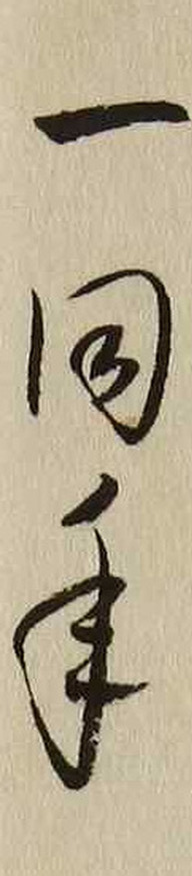一同年
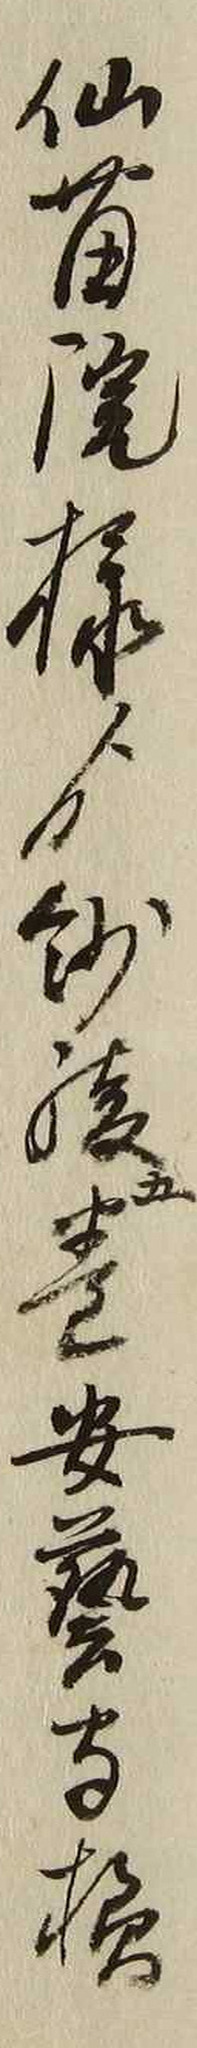仙苗院様ゟ紗綾五巻安芸守様
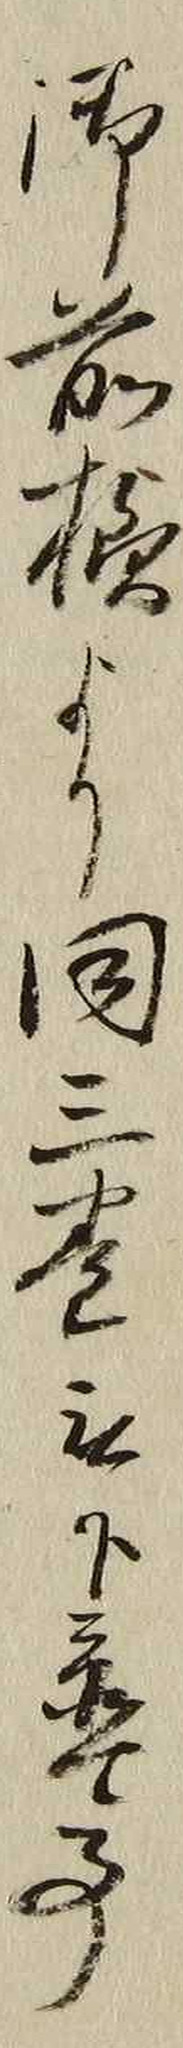御前様より同三巻被下置候事
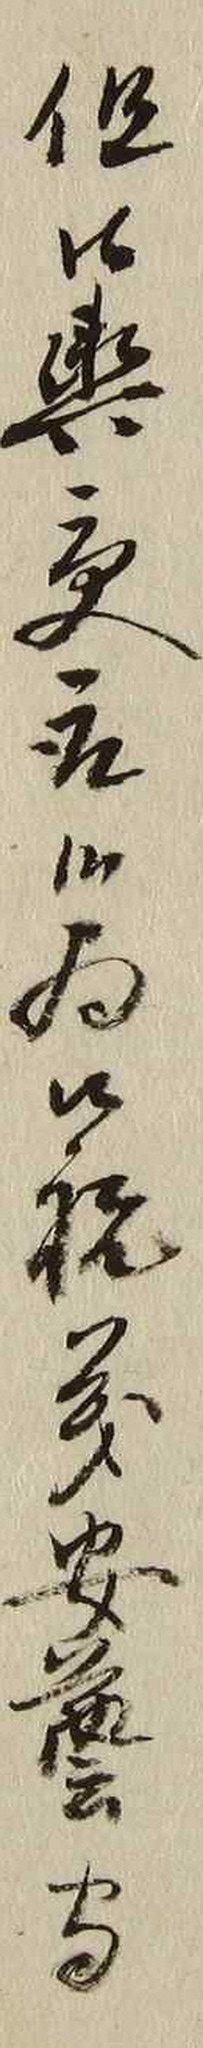但御輿受取候為御祝義安芸守
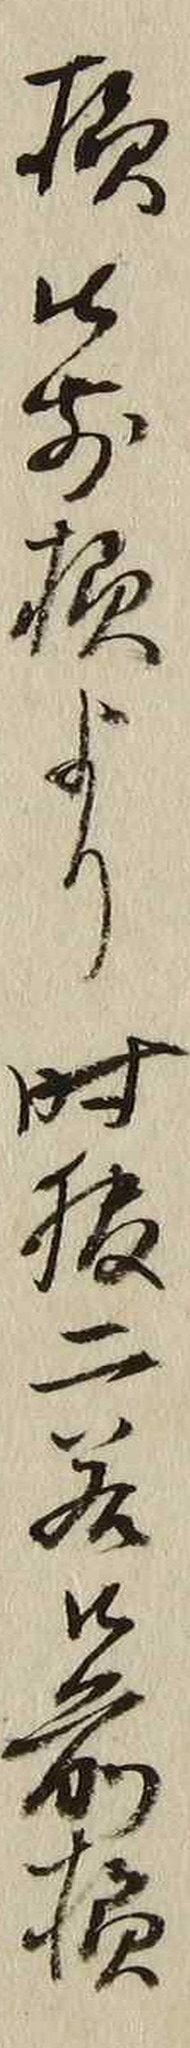様御前様より時服二若御前様
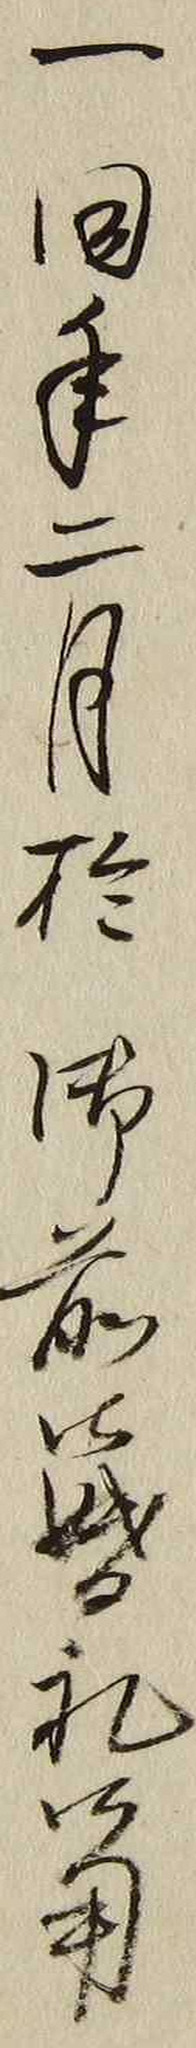一同年二月於御前御婚礼御用
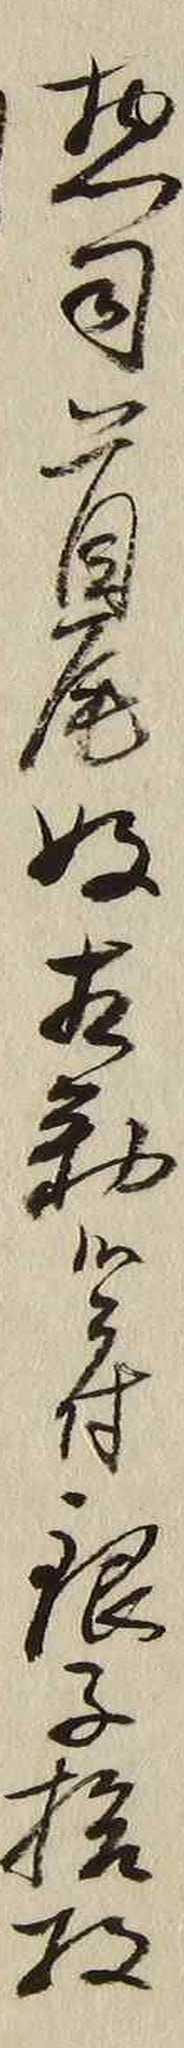惣司首尾好相勤候ニ付銀子数枚
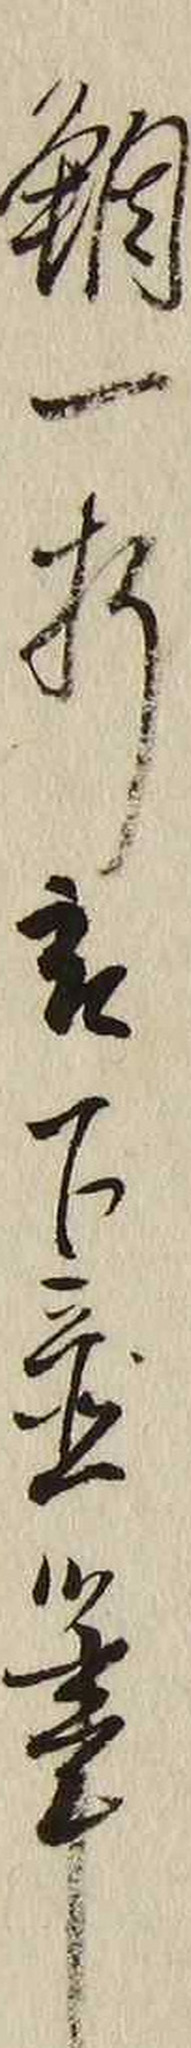鯛一折被下置候事
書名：諸士系譜　巻之351　す之部1
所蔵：会津若松市立会津図書館
